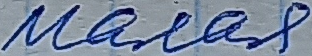малая
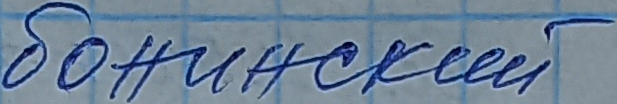бонинский
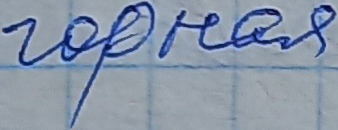горная
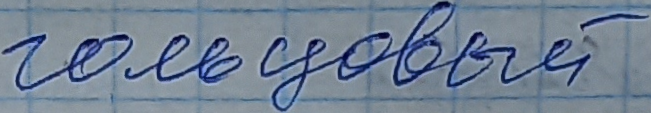гольцовый
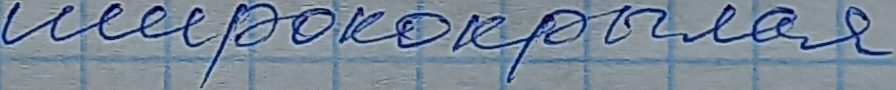ширококрылая
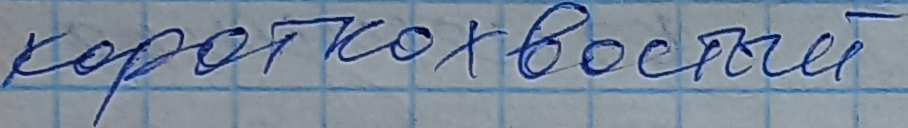короткохвостый
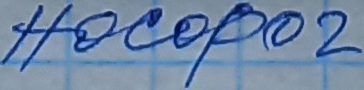носорог
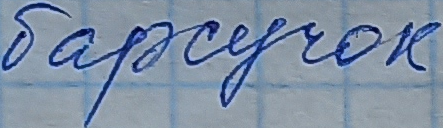барсучок
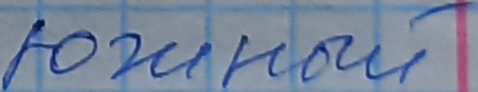южный
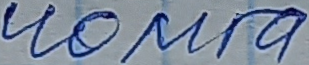чомга
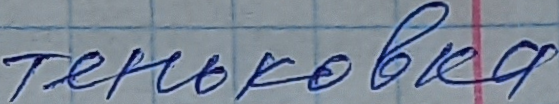теньковка
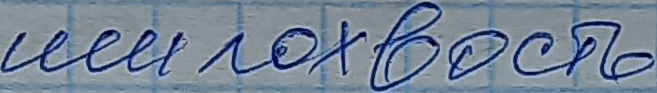шилохвость
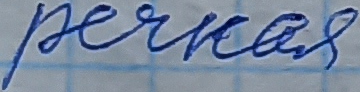речная
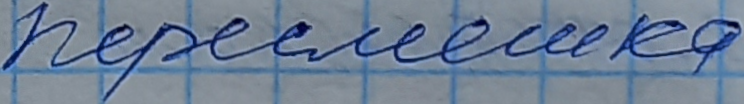пересмешка
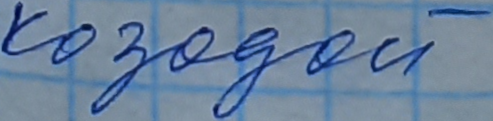козодой
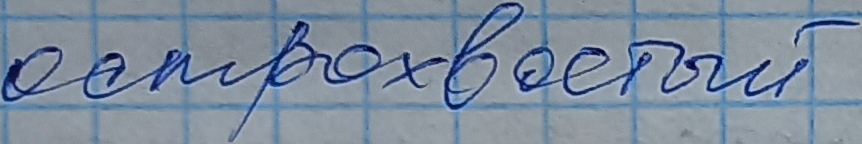острохвостый
